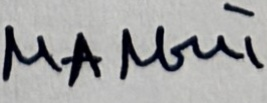малый
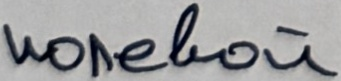полевой
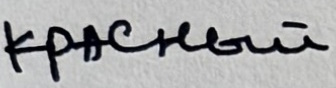красный
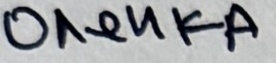оляпка
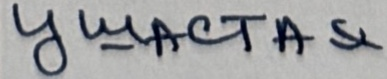ушастая
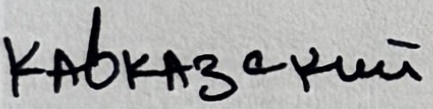кавказский
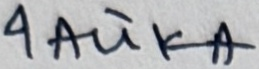чайка
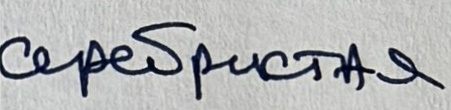серебристая
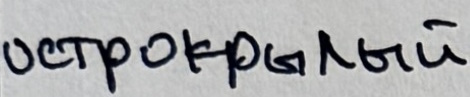острокрылый
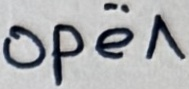орёл
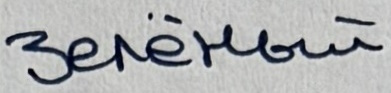зелёный
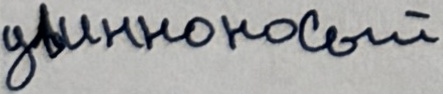длинноносый
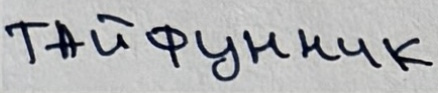тайфунник
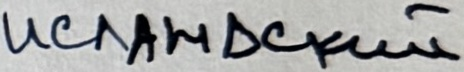исландский
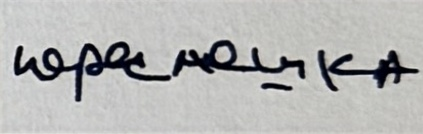пересмешка
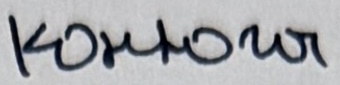конюга
